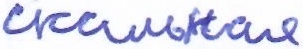скальная
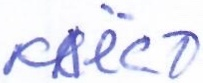клёст
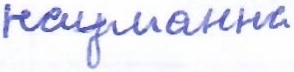науманна
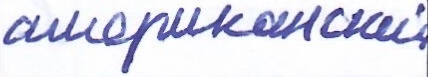американский
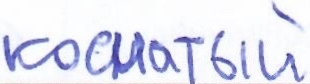косматый
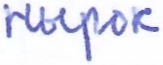нырок
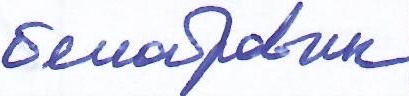белобровик
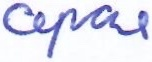серая
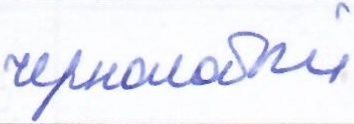чернолобый
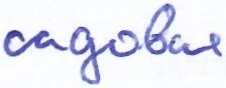садовая
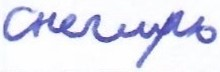снегирь
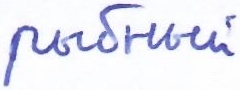рыбный
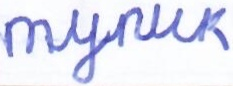тупик
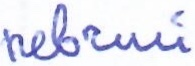певчий
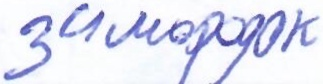зимородок
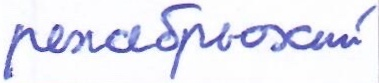режебрюхий
